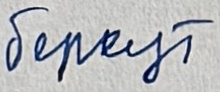беркут
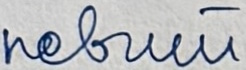певчий
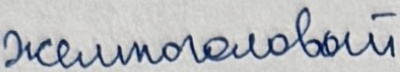желтоголовый
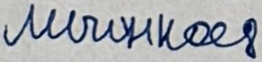личинкоед
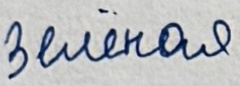зелёная
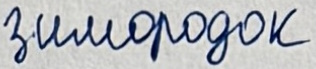зимородок
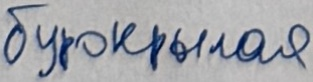бурокрылая
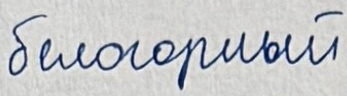белогорлый
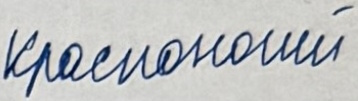красноногий
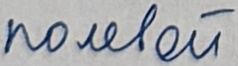полевой
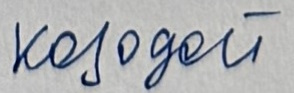козодой
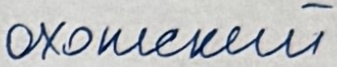охотский
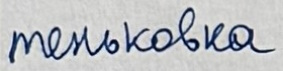теньковка
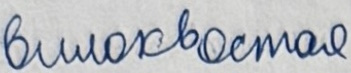вилохвостая
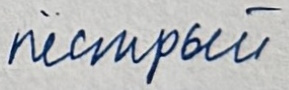пёстрый
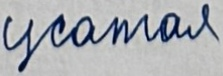усатая
